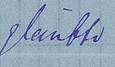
glaubte
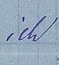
ich
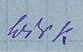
lich es
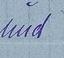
könnte
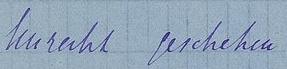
Unrecht geschehen;
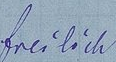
freilich
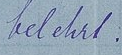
belehrt.
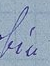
war
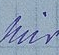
Herr
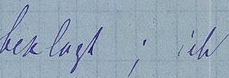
beklagt; ich
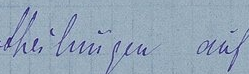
theilungen auf
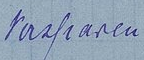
sich dieselbe
